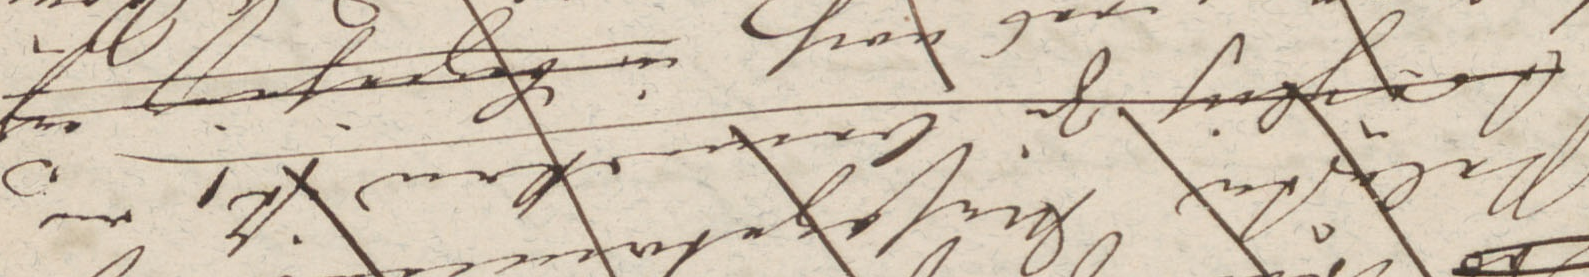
des Asiatischen altere Luxus Asiatischer
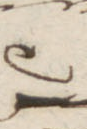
und
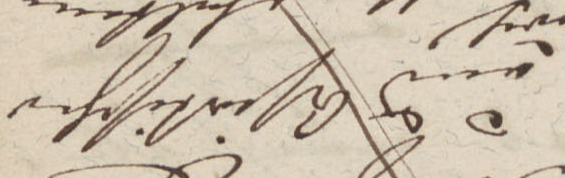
unterrichtet sind
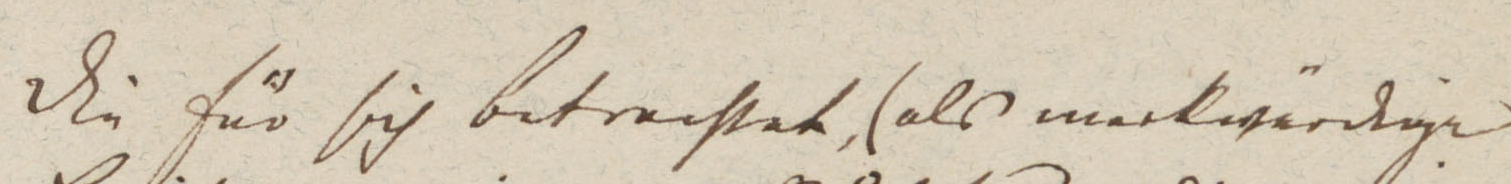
die für sich betrachtet, (als merkwürdige
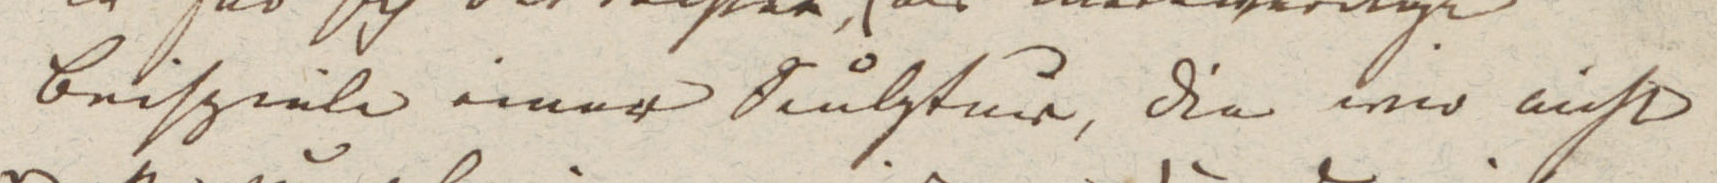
Beispiele einer Skulptur, die wir nicht
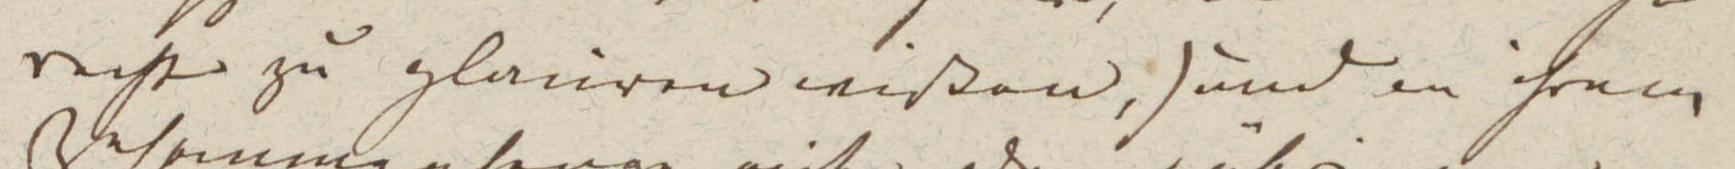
recht zu placiren wissen,) und in ihrem
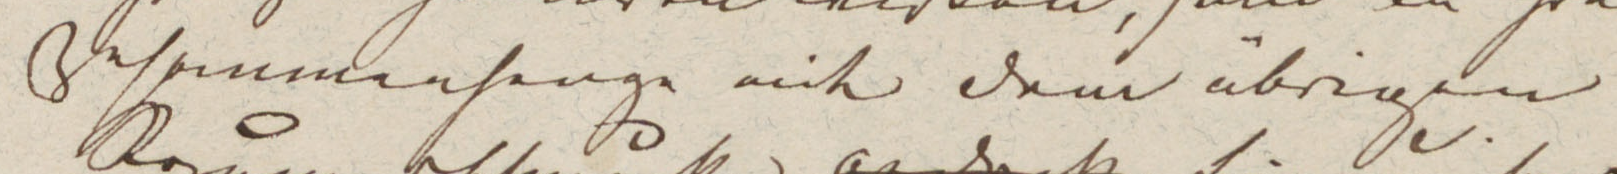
Zusammenhange mit dem übrigen
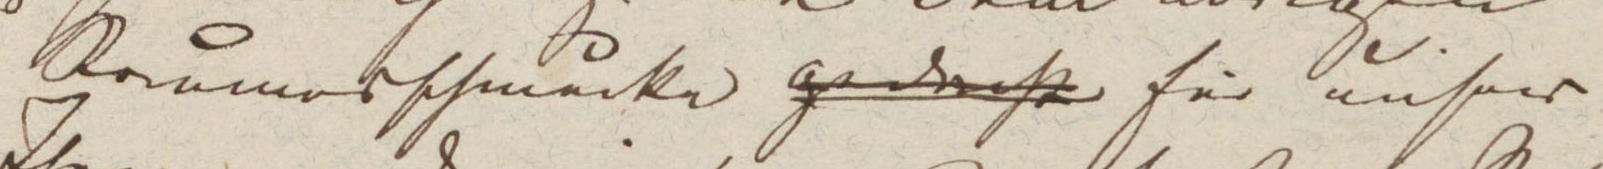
Raumesschmucke gedacht für unser
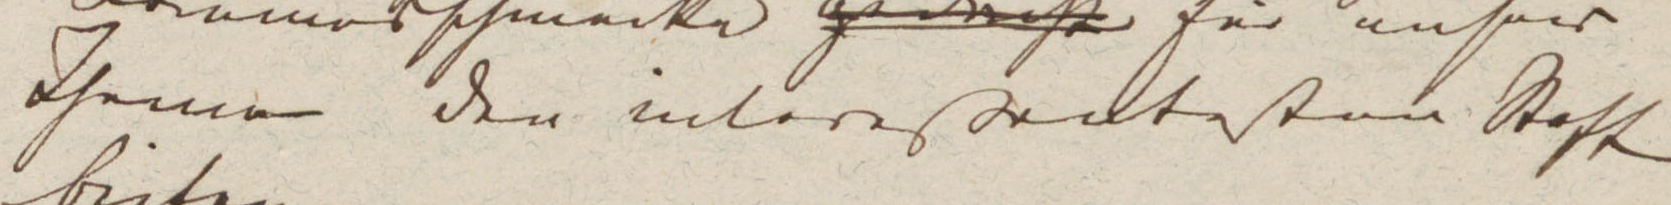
Thema den interessantesten Stoff
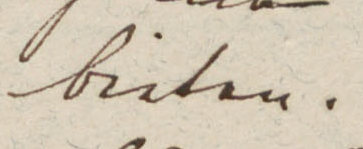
bieten.
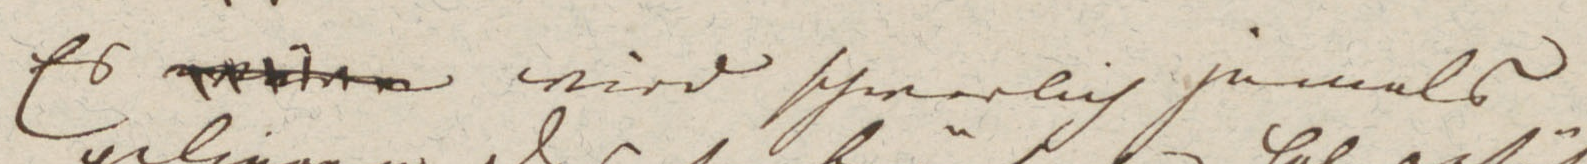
Es wäre wird schwerlich jemals
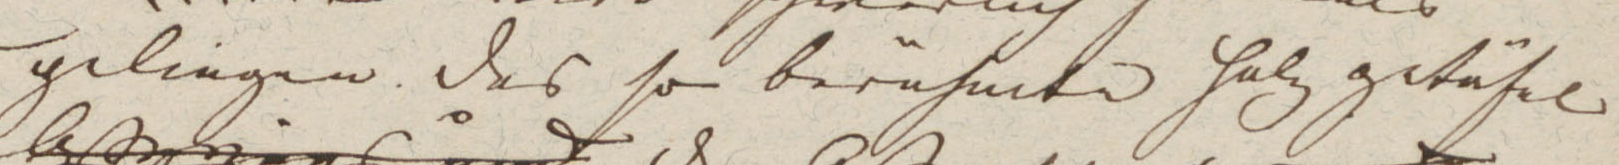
gelingen das so berühmte Holz getäfel
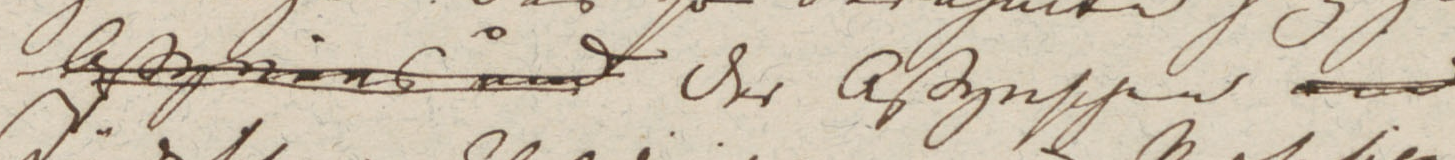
Assyriens und der Assyrischen und
